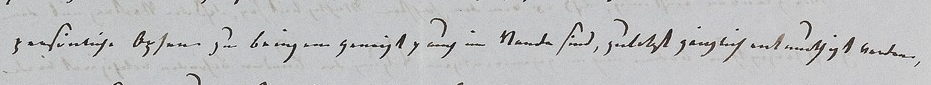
persönliche Opfer zu bringen geneigt & auch im Stande sind, zuletzt gänzlich entmuthigt werden,
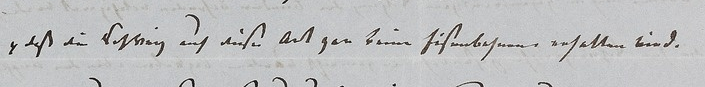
& daß die Schweiz auf diese Art gar keine Eisenbahnen erhalten wird.
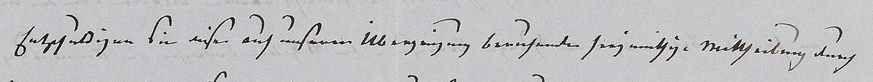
Entschuldigen Sie diese auf unserer Überzeugung beruhende freymüthige Mittheilung durch
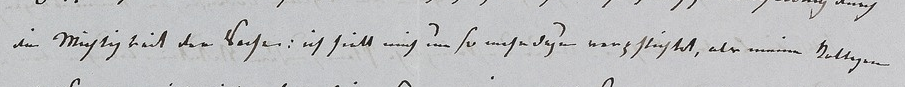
die Wichtigkeit der Sache: ich hielt mich um so mehr dazu verpflichtet, als meine Kollegen
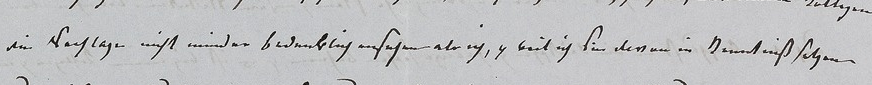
die Sachlage nicht minder bedenklich ansehen als ich, & weil ich Sie davon in Kenntniß setzen
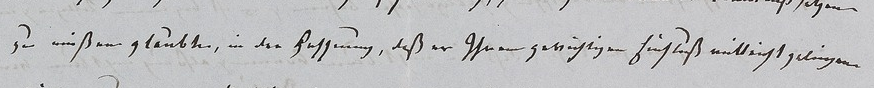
zu müßen glaubte, in der Hoffnung, daß es Ihrem gewichtigen Einfluß vielleicht gelingen
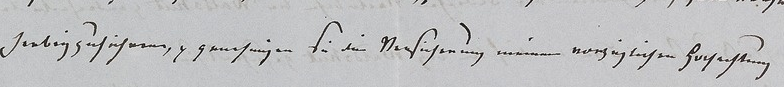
herbeyzuführen, & genehmigen Sie die Versicherung meiner vorzüglichen Hochachtung
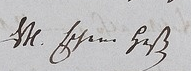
M. Escher Heß
